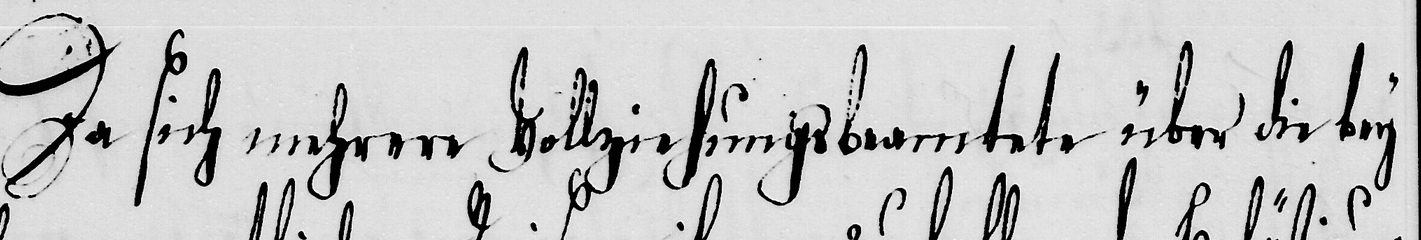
Da sich mehrere Vollziehungsbeamtete über die
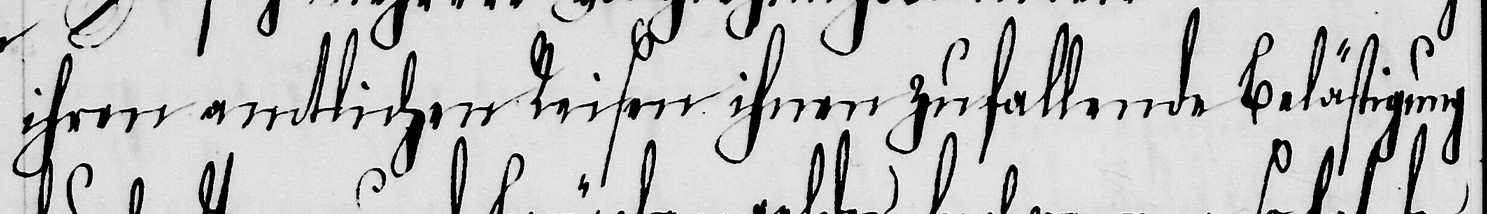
ihren amtlichen Reisen ihnen zufallende Belästigung
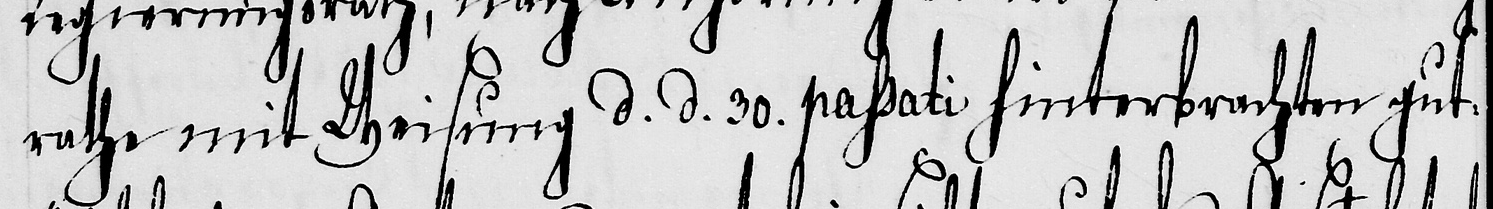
rathe mit Weisung d. d. 30. passati hinterbrachten gut¬
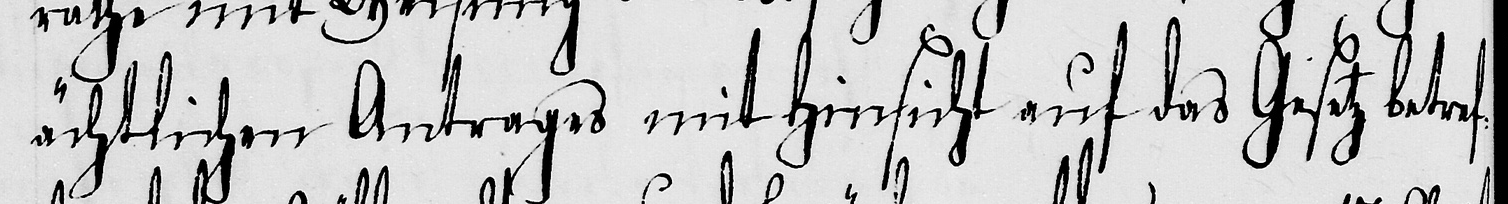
ächtlichen Antrages mit Hinsicht auf das Gesetz be¬
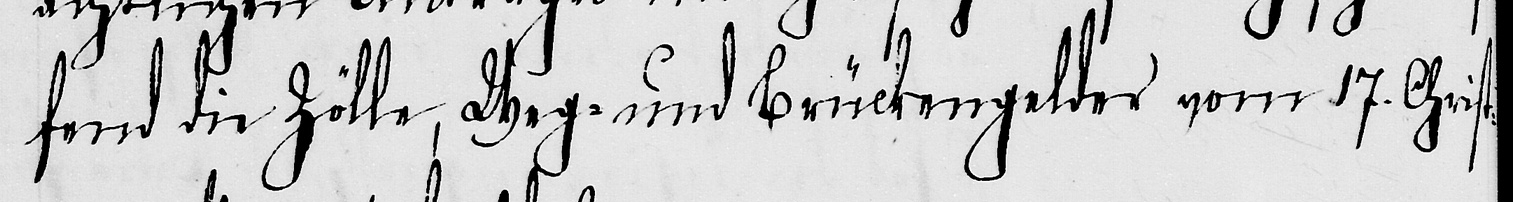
fend die Zölle, Weg- und Brückengelder vom 17. Chris¬
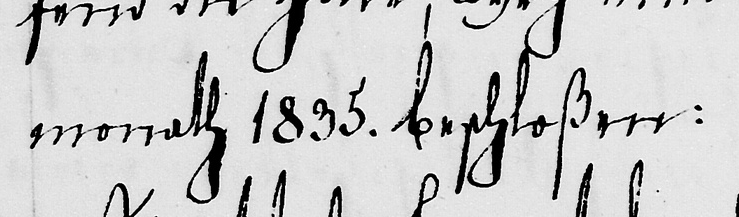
tmonath 1835. beschloßen:
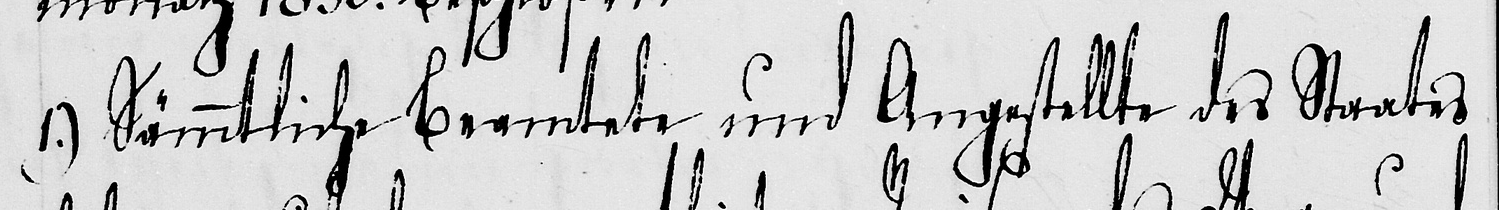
1.) Sämmtliche Beamtete und Angestellte des Staates
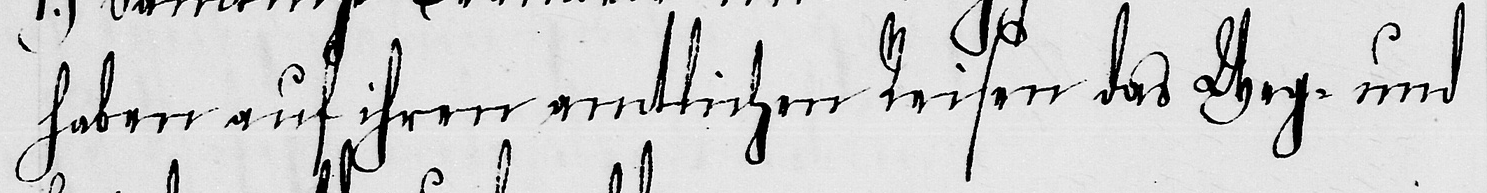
haben auf ihren amtlichen Reisen das Weg- und
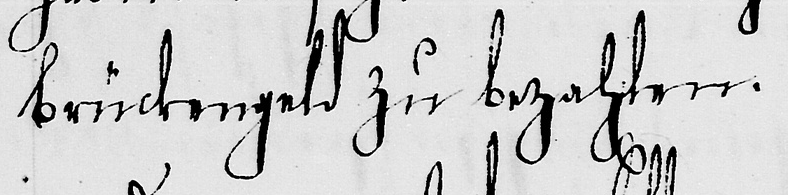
Brückengeld zu bezahlen.
